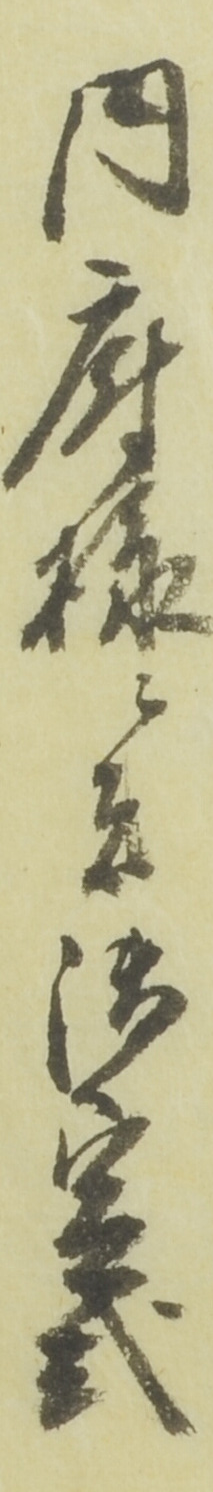円府様ニは御定式
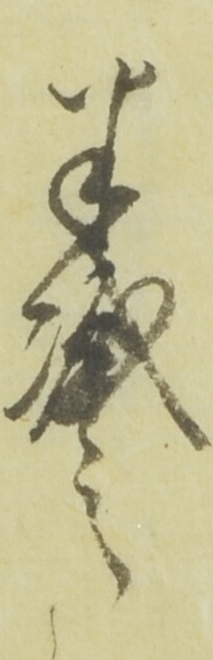半減之
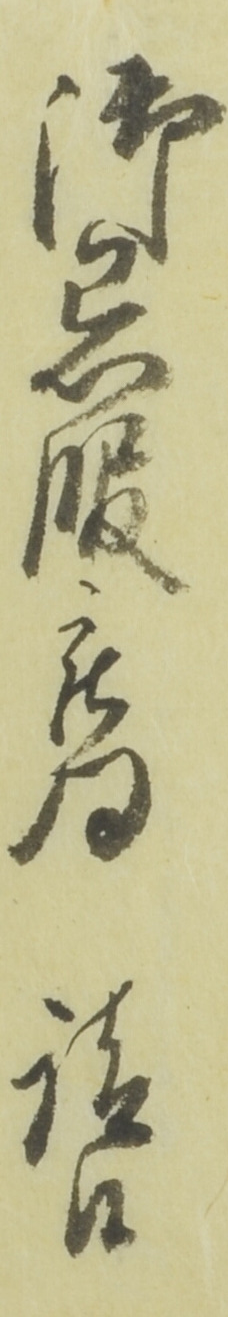御忌服被為請候
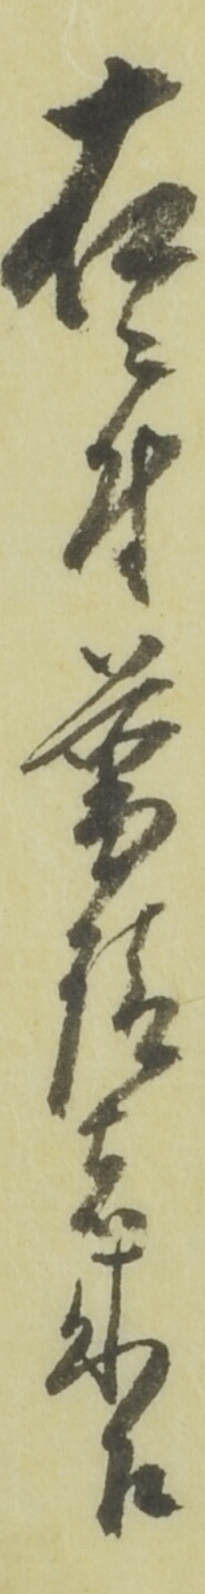右ニ付普請は来ル
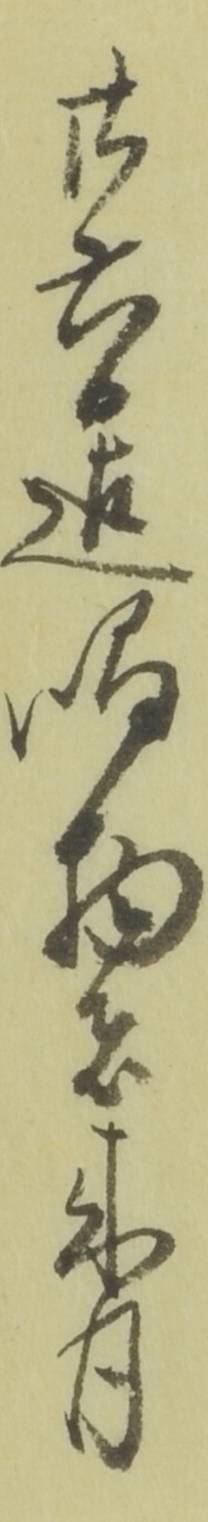廿六日迄鳴物は来月
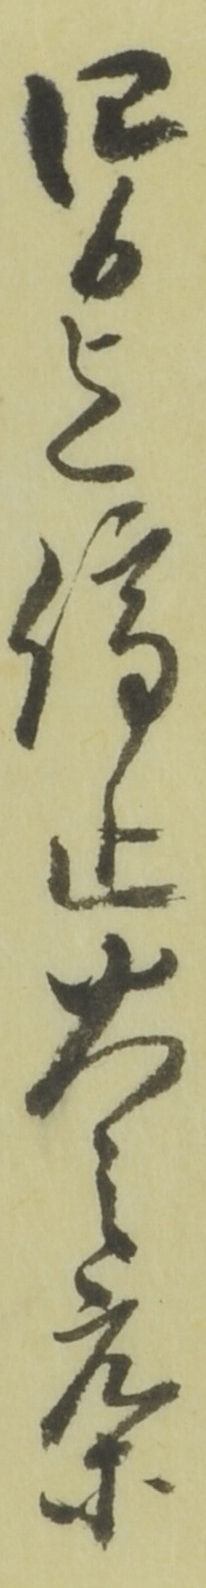四日迄停止火之元等
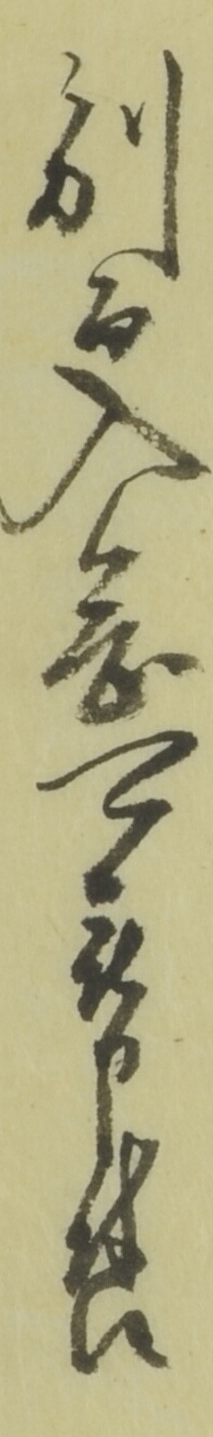別而入念可被申付候
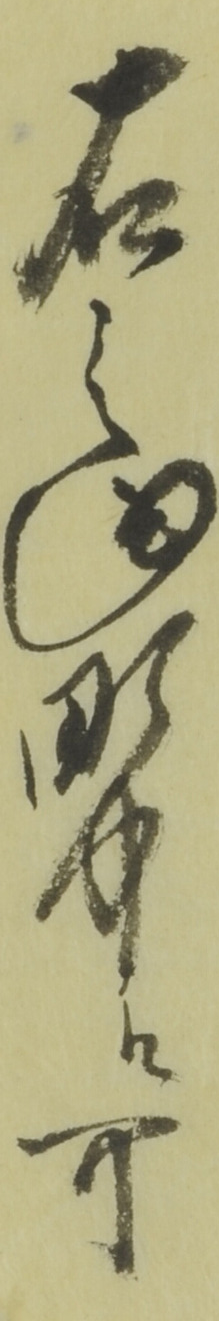右之趣町中江可

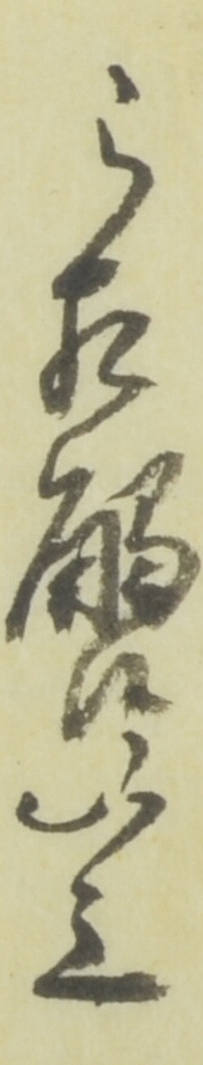被相触候以上
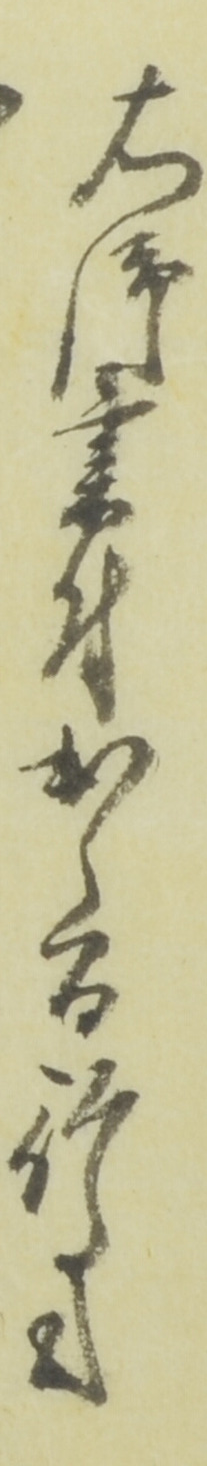右御書付出候間行司
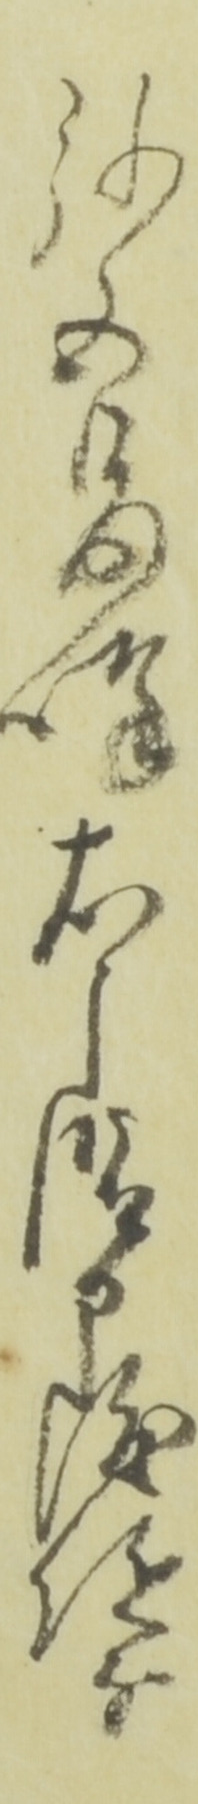弥五日ゟ呼右之暦申渡随分
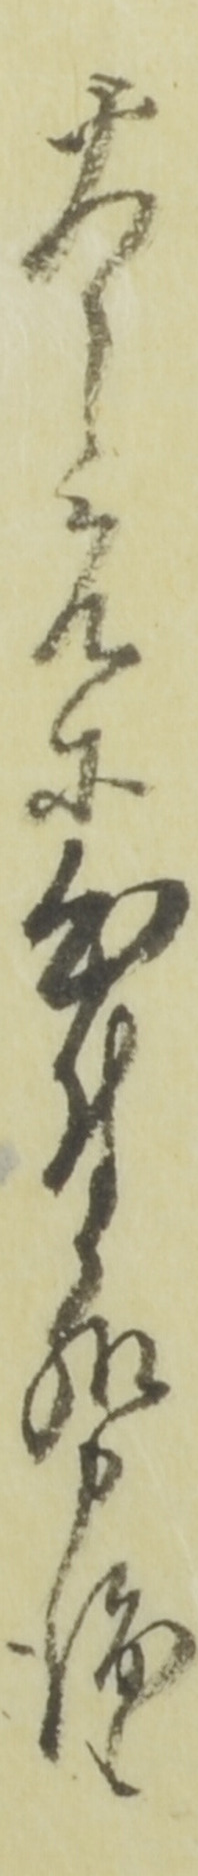火之元等心付候様申渡候
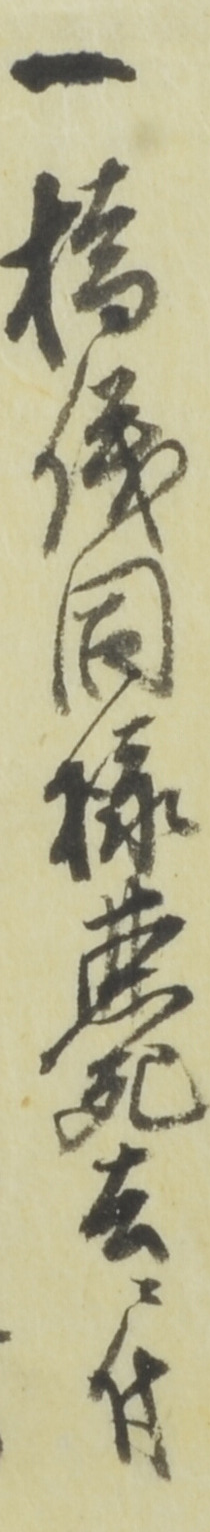一橋儀同様薨去ニ付
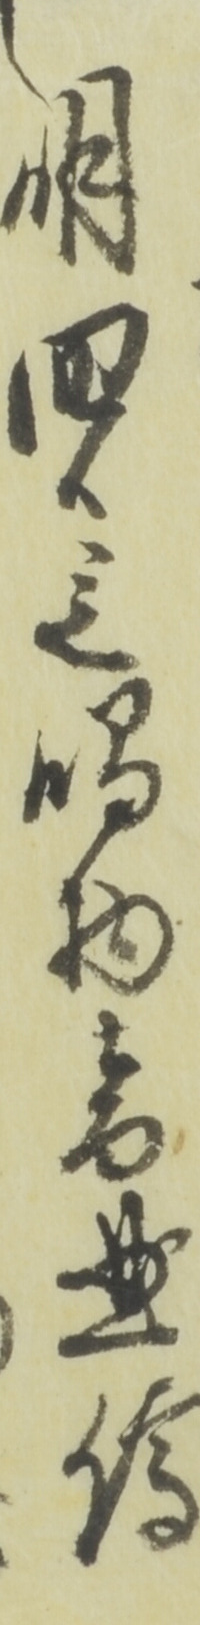明四日迄鳴物音曲停
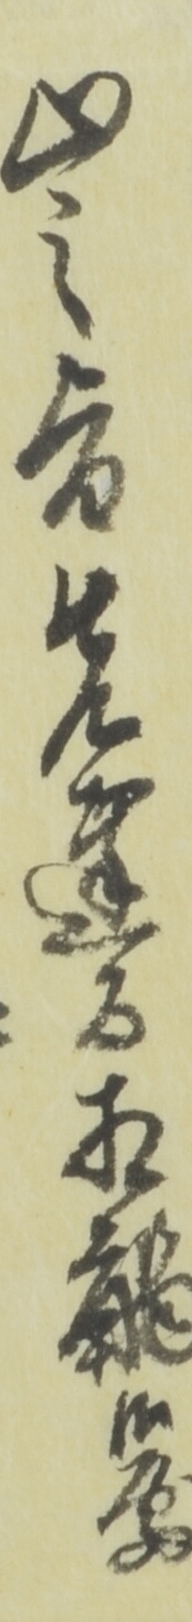止之旨先達而相触候処
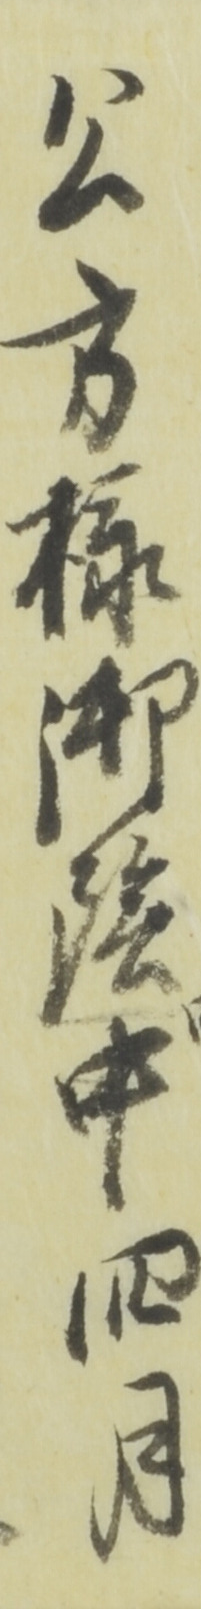公方様御陣中四月
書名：御触書御書附控
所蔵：伊那市立高遠町図書館・合同会社AMANE
